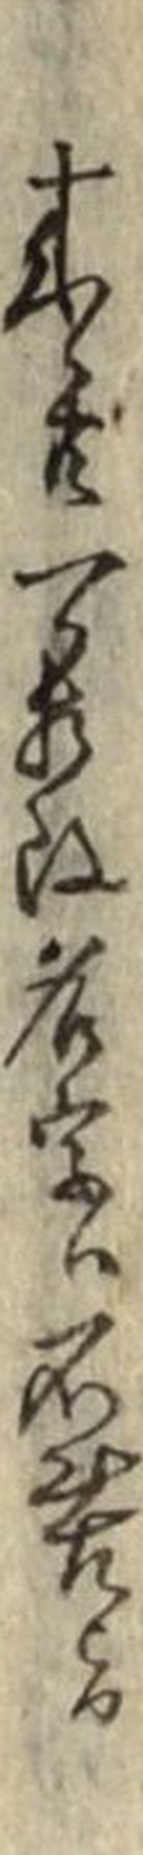来候共可相改名字は不苦旨
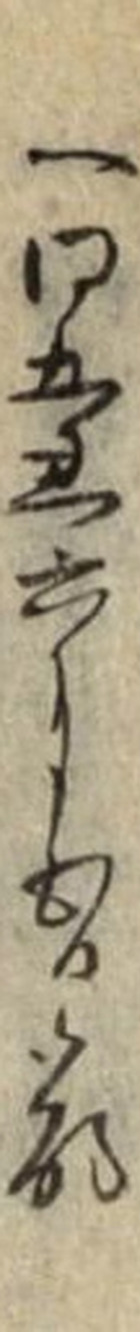一同五丑六月五日御触
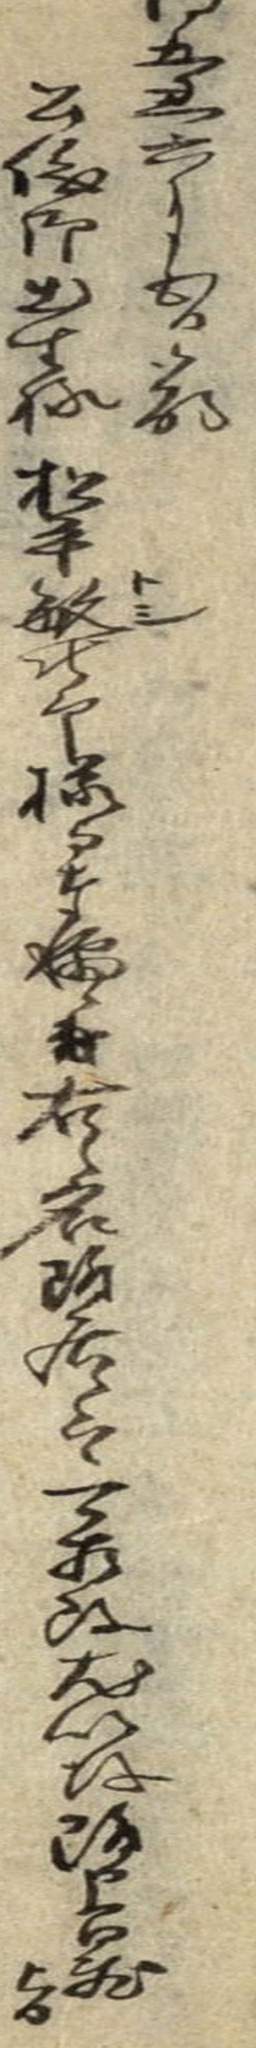公儀御出生様松平敏次郎様と奉称候に付右之名附居候はゝ可相改尤以後附申間敷旨
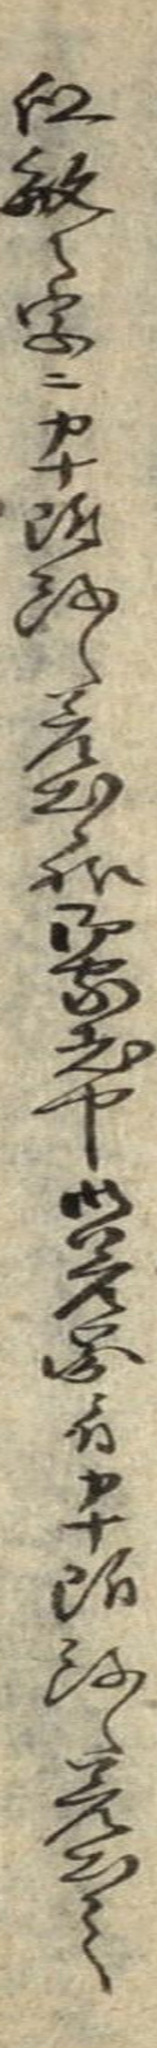但敏之字にカナ附改之差出候様御家老中御差図に附カナ附改之差出之
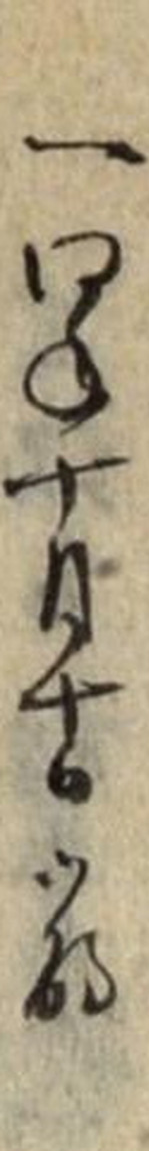一同年十月十日御触
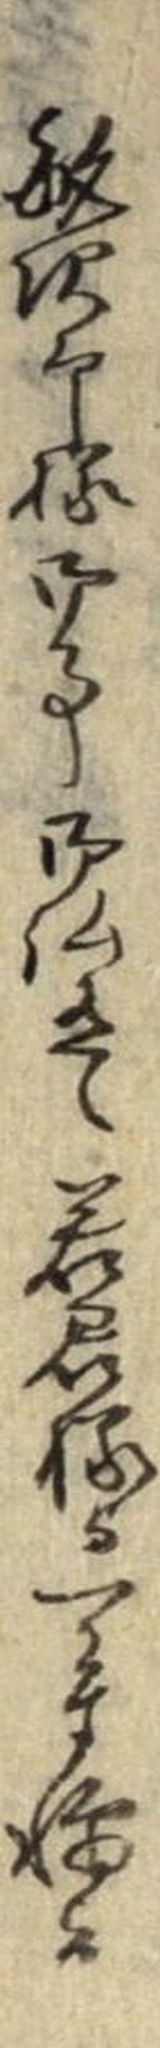敏次郎様御事御弘有之若君様と可奉称旨

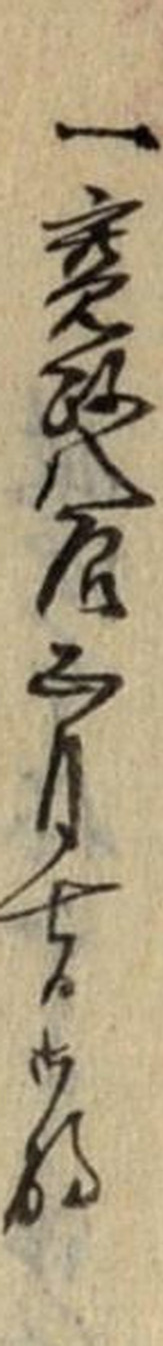一寛政八辰正月七日御触
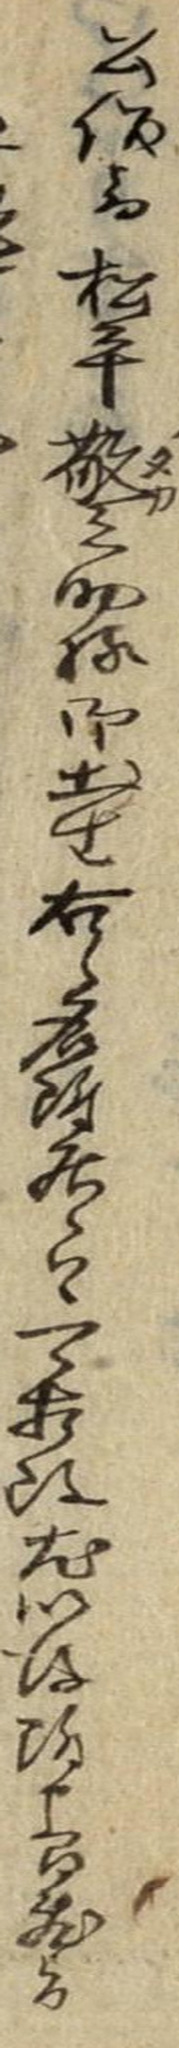公儀に而松平敬之助様御出生右之名附居候はゝ可相改尤以後附申間敷旨
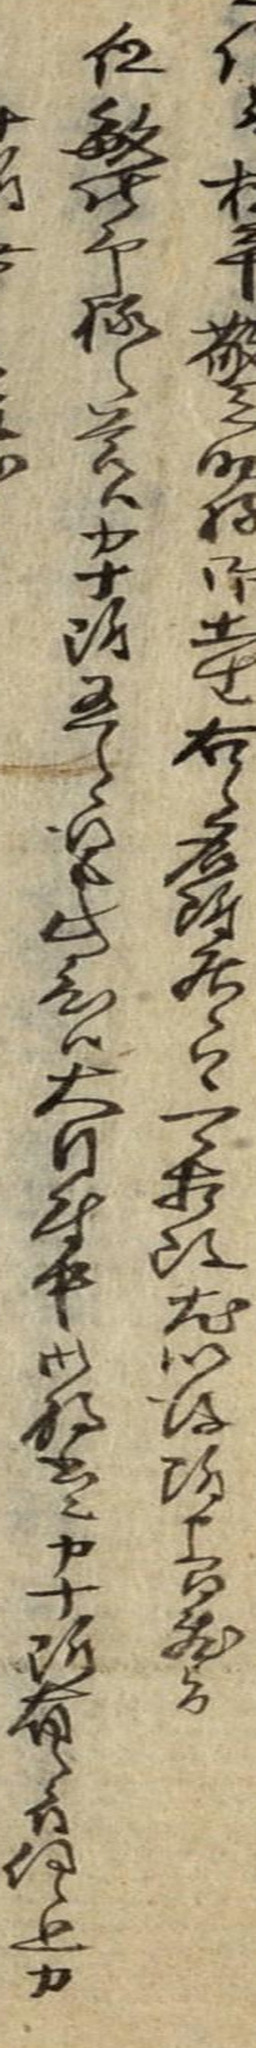但敏次郎様之節はカナ附有之候得共此度は大目付中御触書にカナ附有之候に付伺之上カ
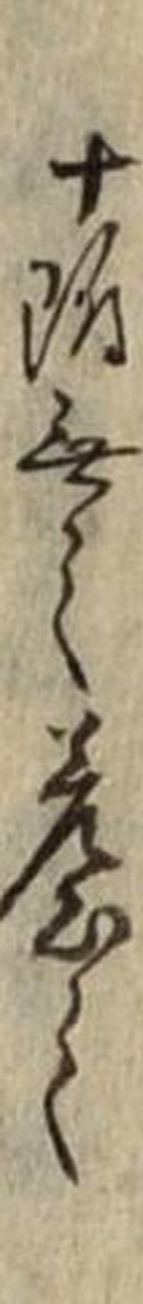ナ附無之差出之
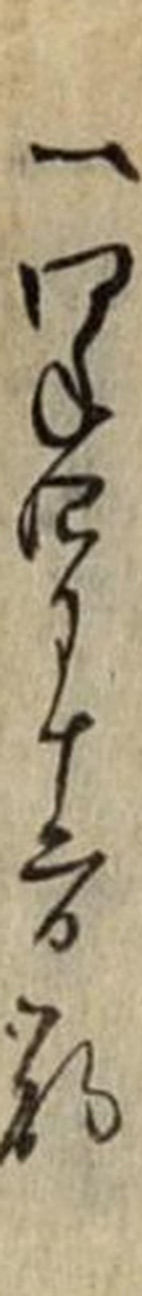一同年四月十二日触
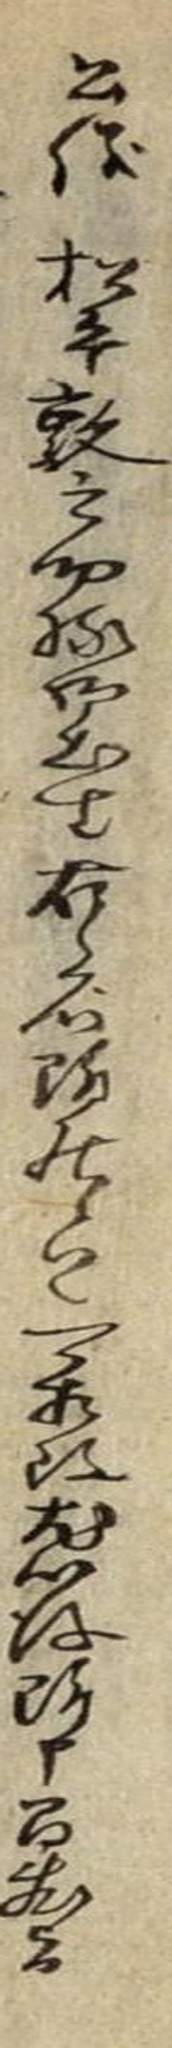公儀松平敦之助様御出生右之名附居候はゝ可相改尤以後附申間敷旨
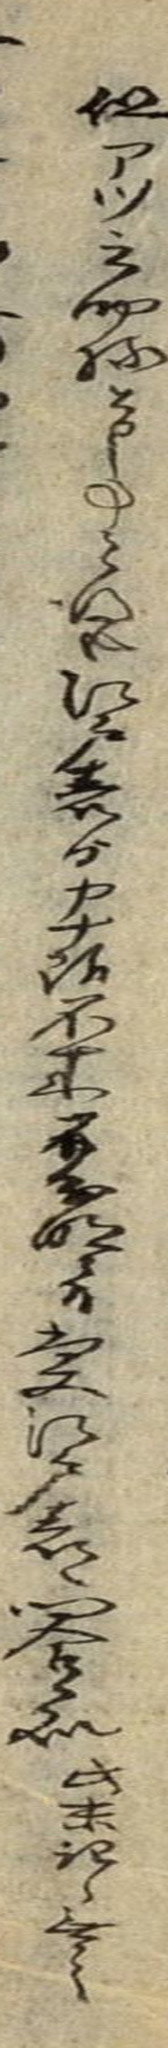但アツ之助様と申事に候得共江戸表ゟカナ附不来不分明に付尚又江戸表へ問合候処此未記に無之
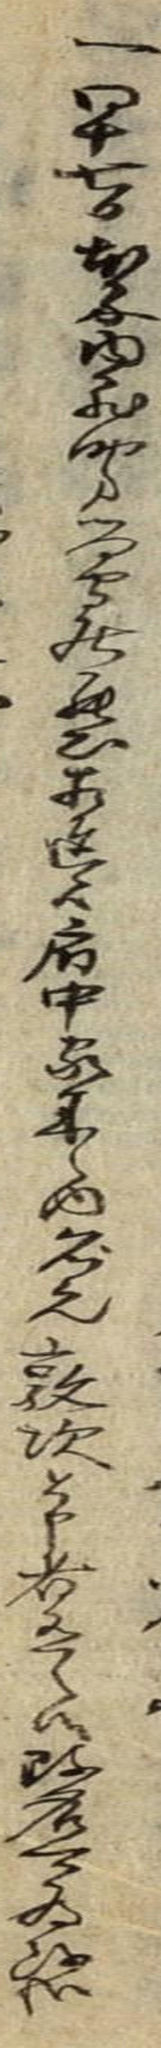一同十七日本多内蔵助方留守居罷出相達候は府中家来之内名元敦次と申者有之候改名可為致哉
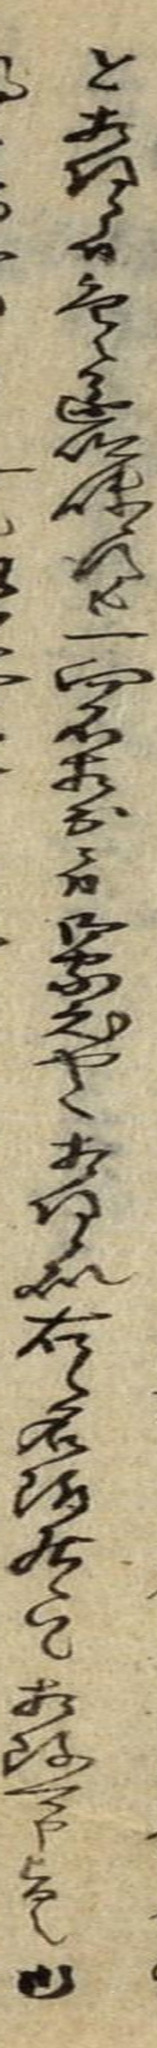と相伺候に付色々遂吟味候得共一向不相分に付御家老中へ相伺候処右之名附居候はゝ相改可申旨之御
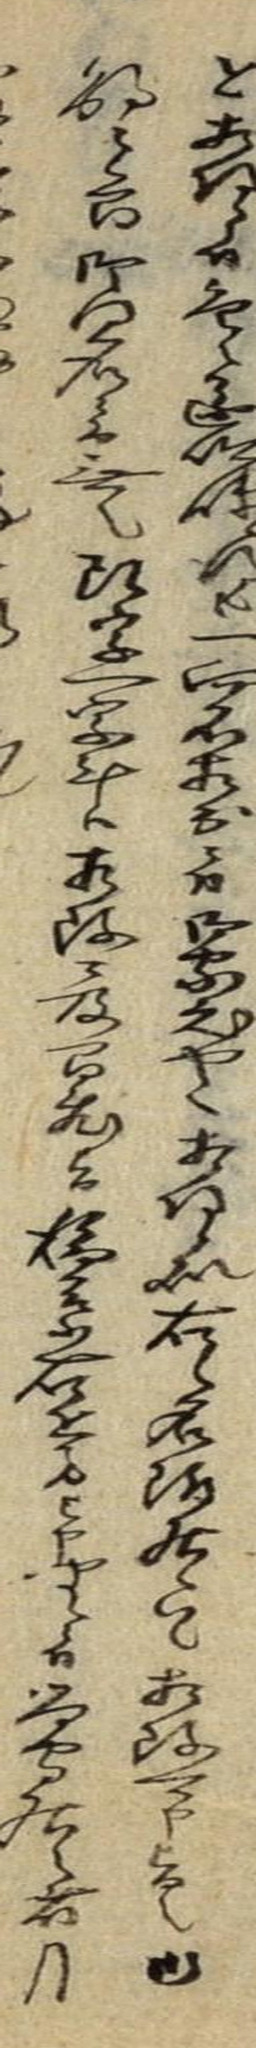触に候間御同名に而無之頭字一字斗は相改に及間敷旨稻葉右近方被申聞候に付留守居之者月
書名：蒐輯之部
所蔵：福井県文書館 Fukui Prefectural Archives
